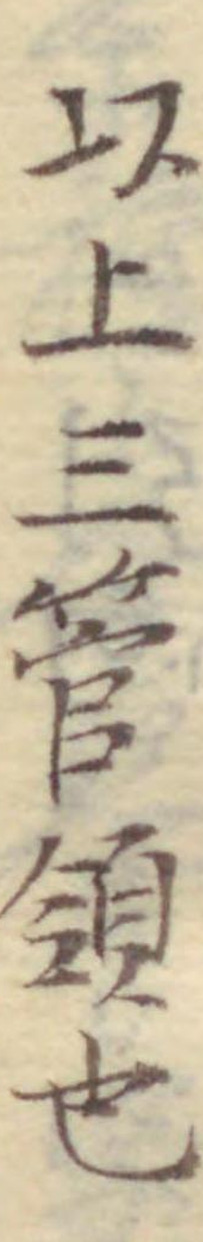以上三管領也
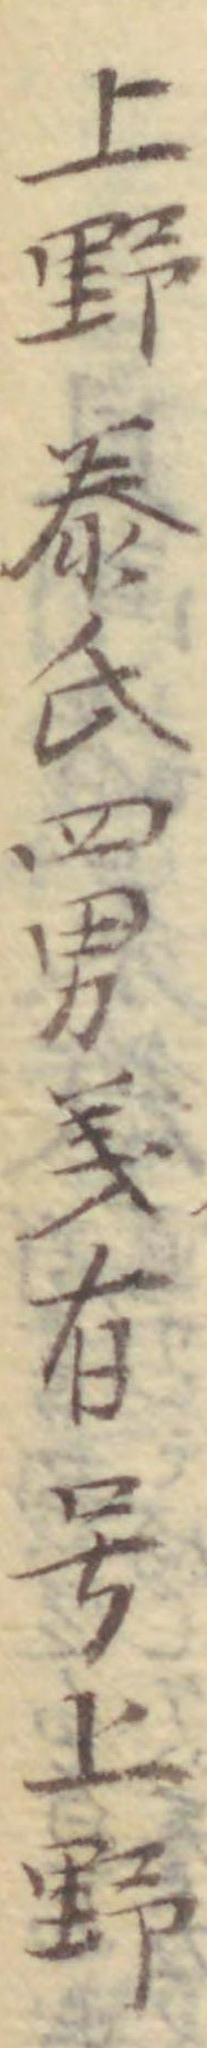上野泰氏四男義有号上野
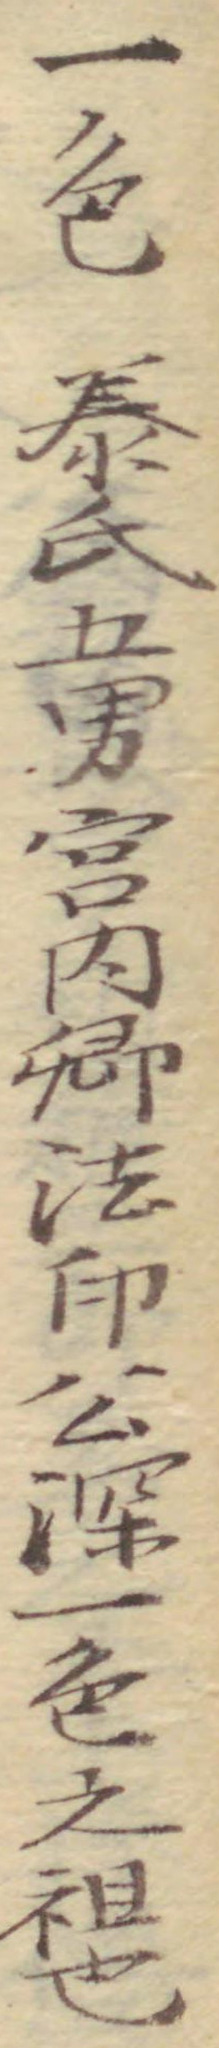一色泰氏五男宮内卿法印公深一色之祖也
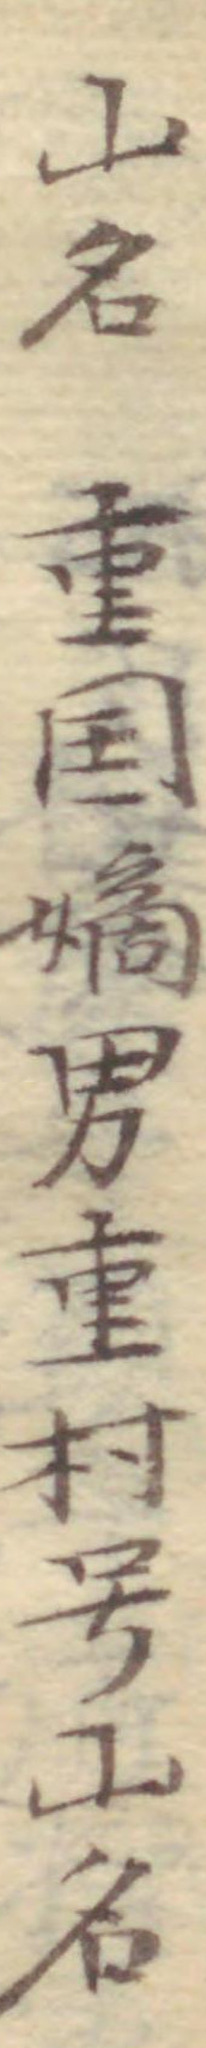山名重国嫡男重村号山名
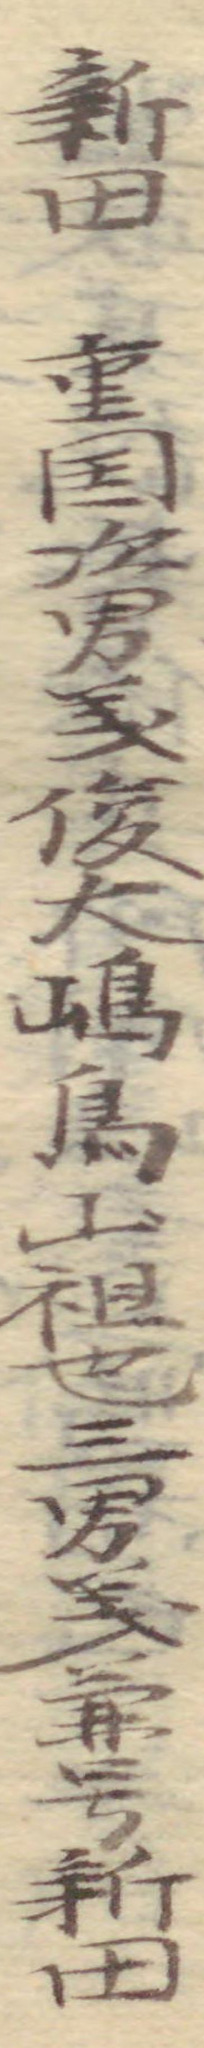新田重国次男義俊大嶋鳥山祖也三男義兼号新田
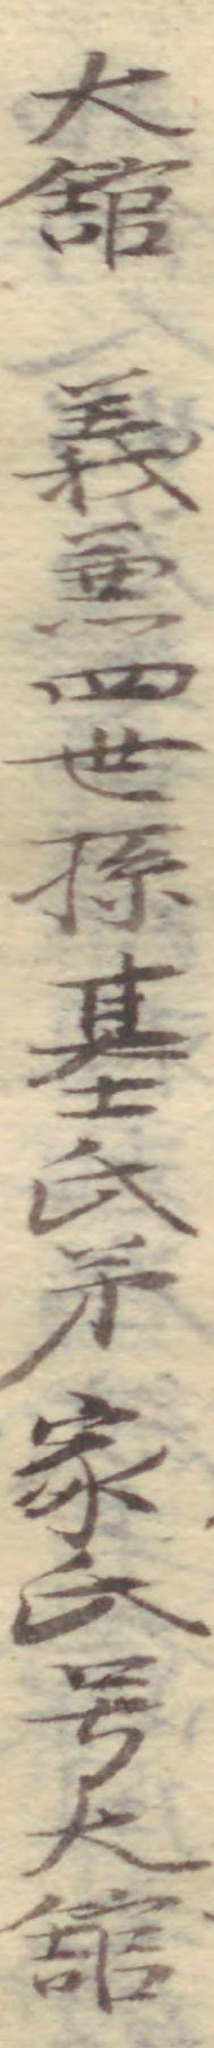大館義兼四世孫基氏弟家氏号大館
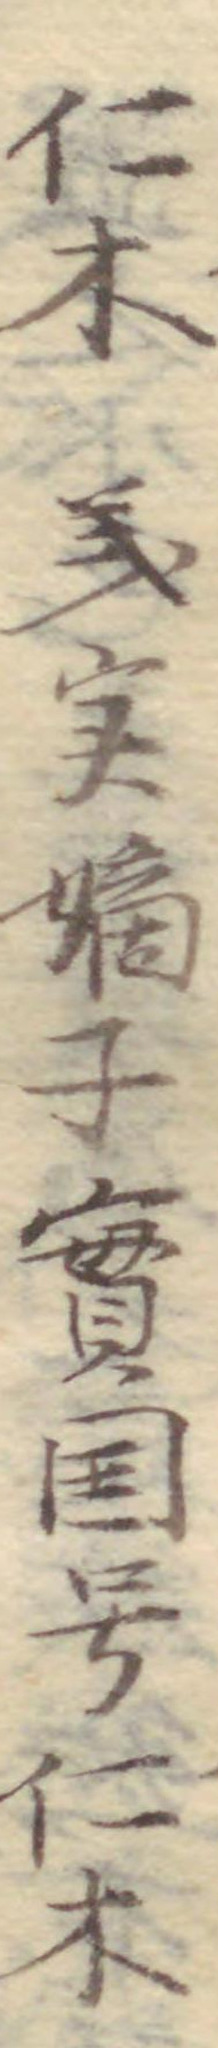仁木義実嫡子実国号仁木
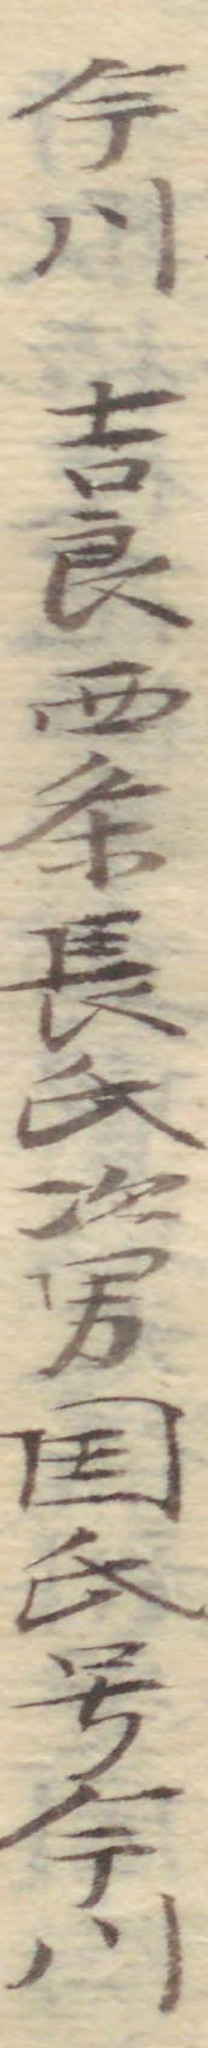今川吉良西条長氏次男国氏号今川
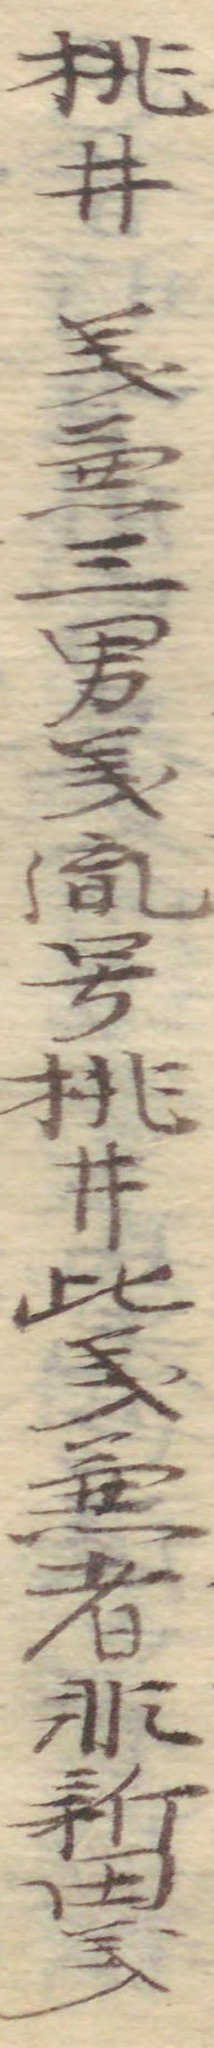桃井義兼三男義胤号桃井此義兼者非新田義
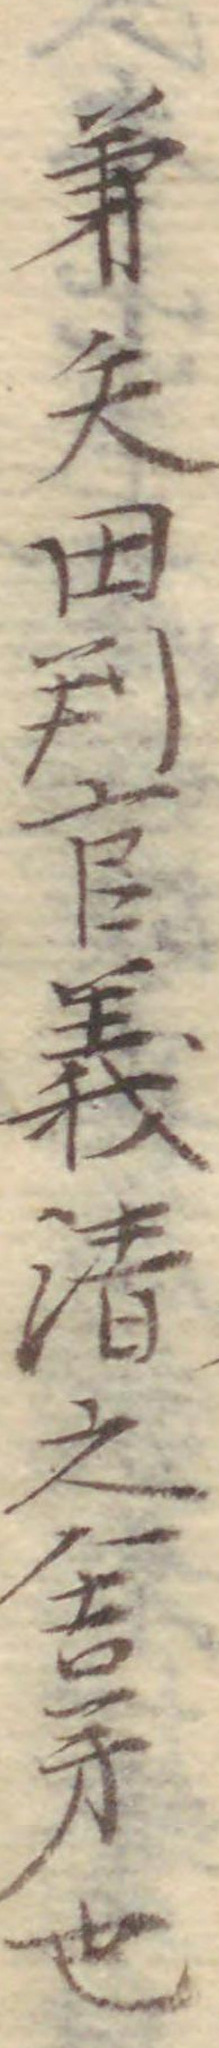兼矢田判官義清之舎弟也
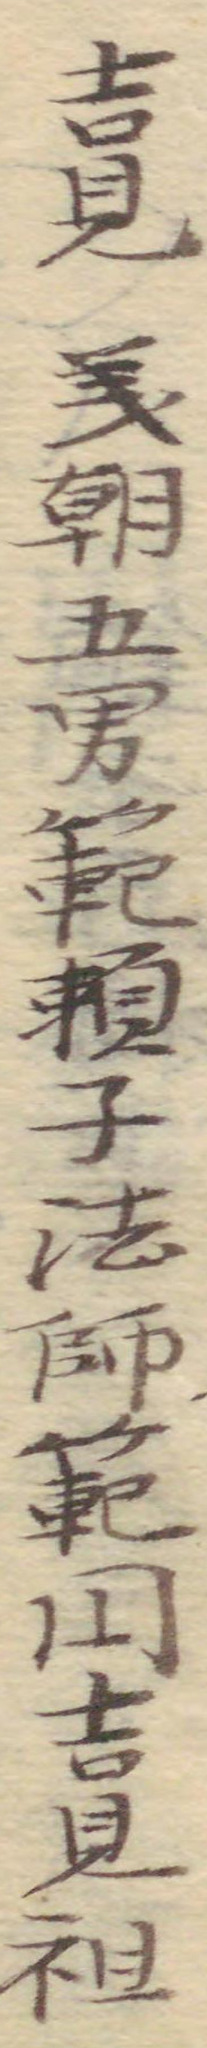吉見義朝五男範頼子法師範円吉見祖
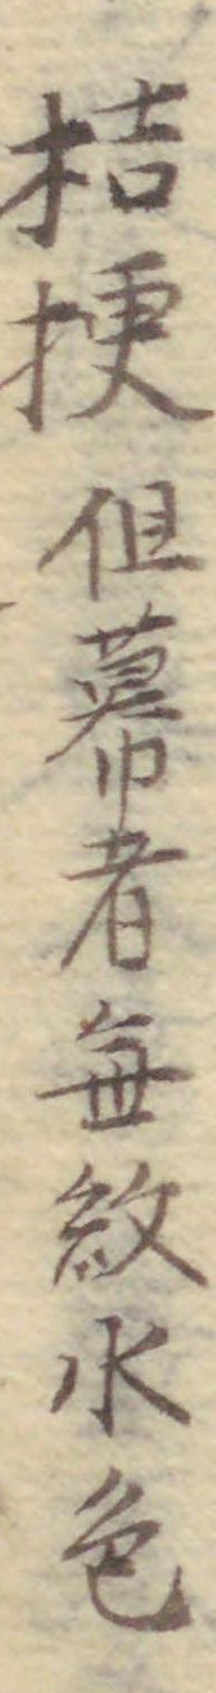桔梗但幕者無紋水色

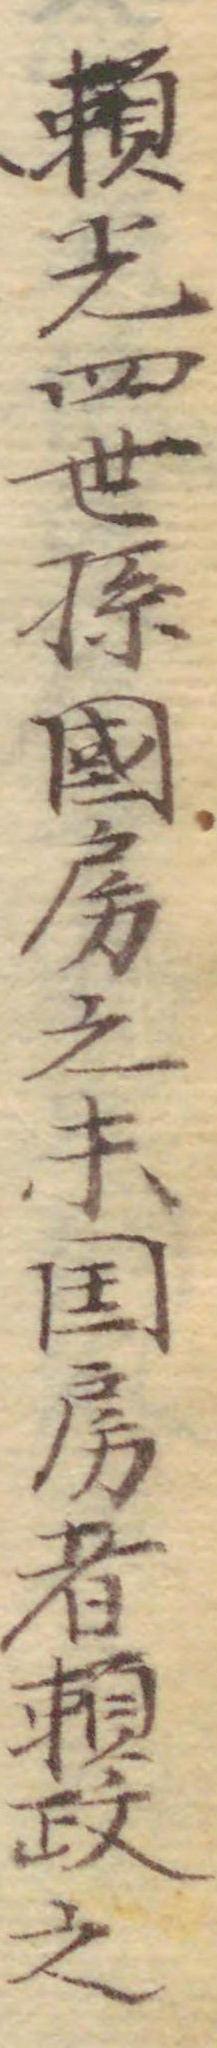頼光四世孫国房之末国房者頼政之
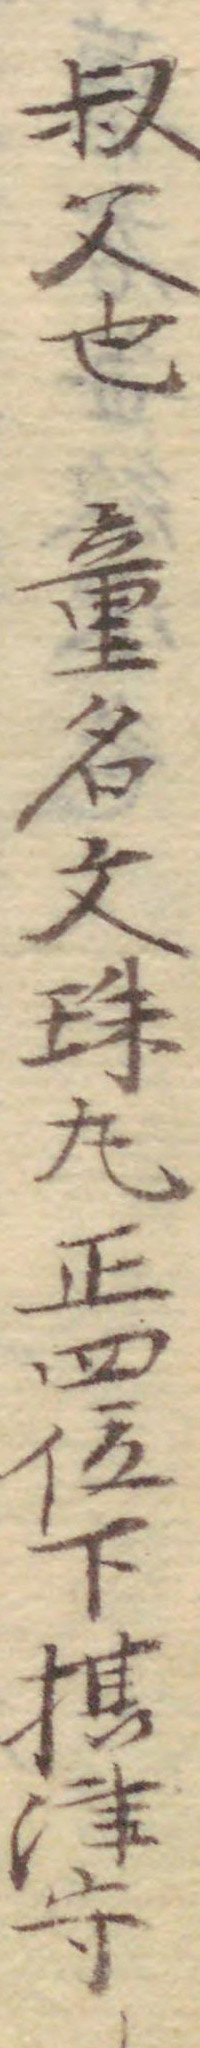叔父也童名文殊丸正四位下摂津守
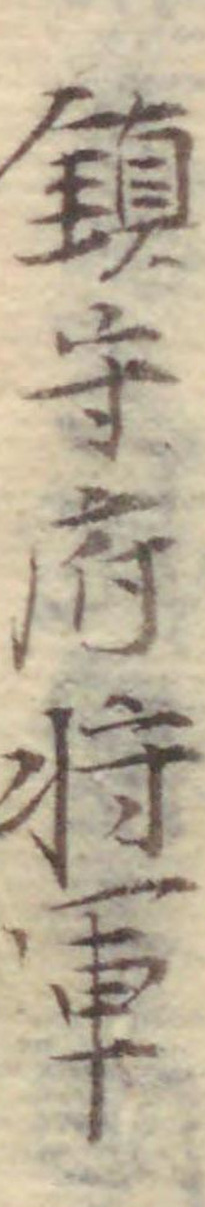鎮守府将軍
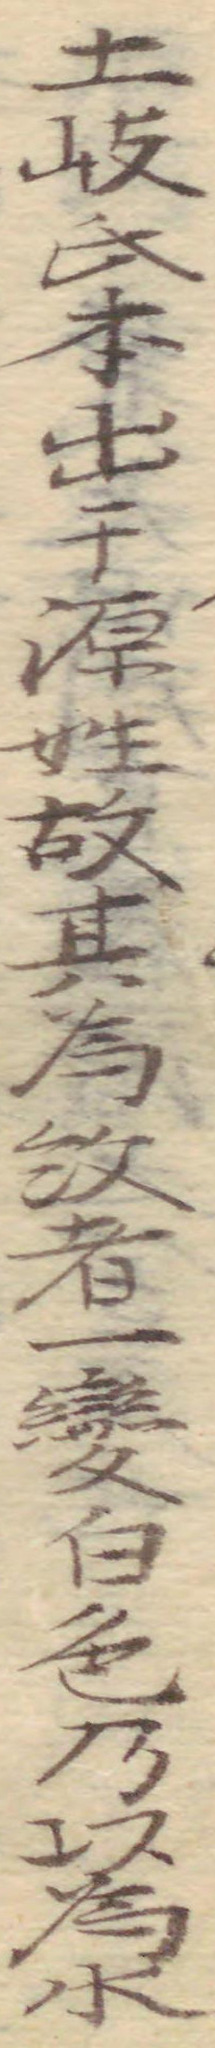土岐市本出于源姓故其為紋者一変白色及以為水
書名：鶯宿雑記. 巻199-200
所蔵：国立国会図書館 National Diet Library, JAPAN
